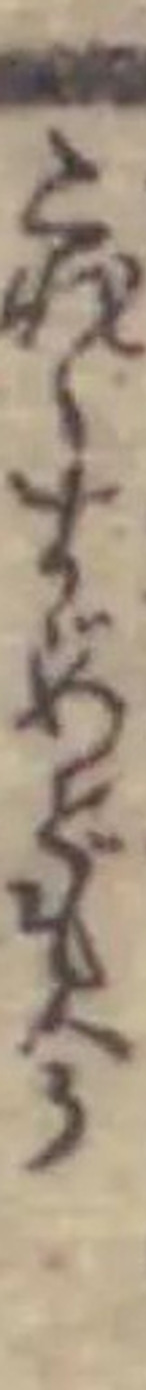これ〳〵すゞめども今
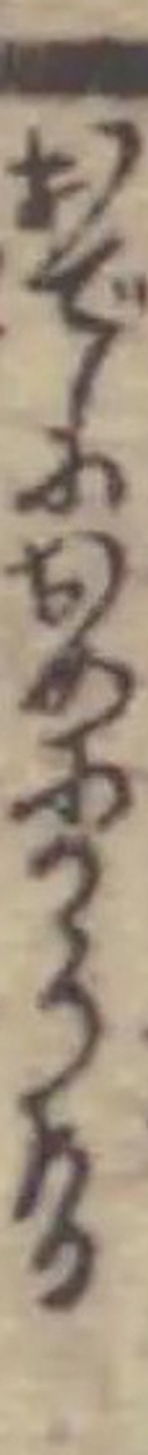おでしにおめにかゝりける
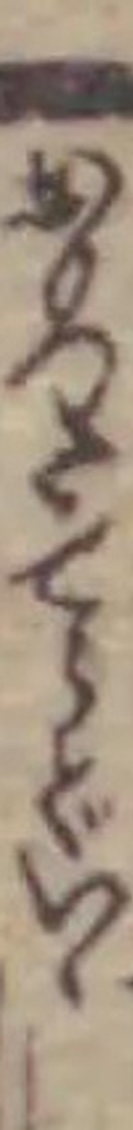おもつたてうどいゝ
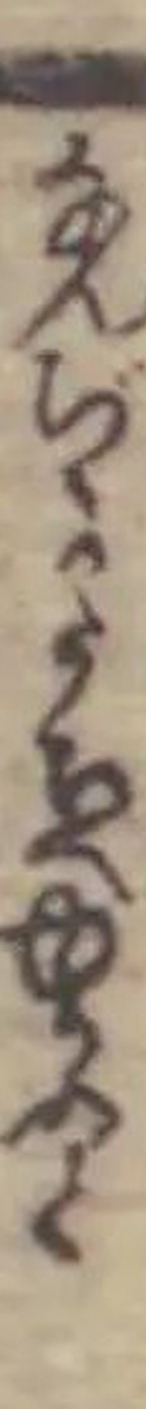なんぢかうちへゆかふと
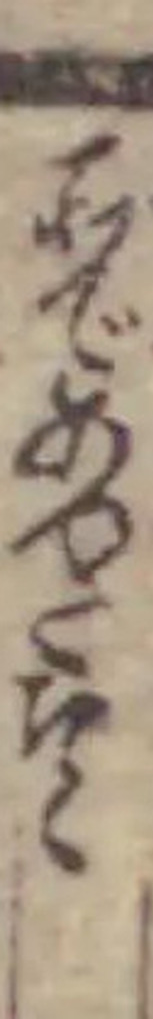所であつたちと
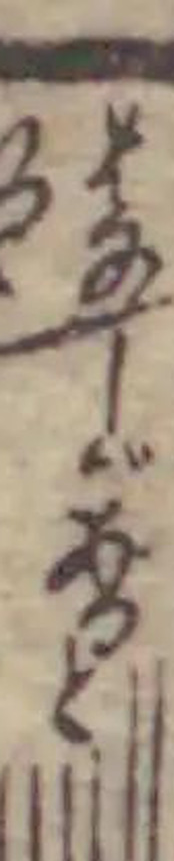はなしがあると
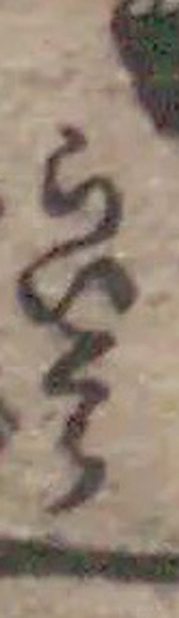らいこう
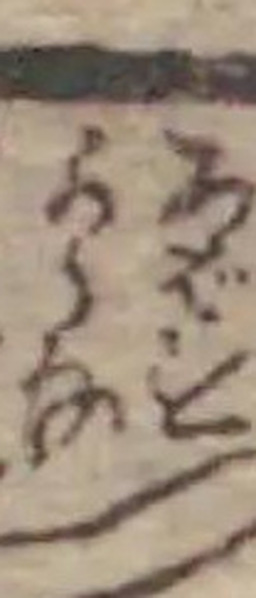ような
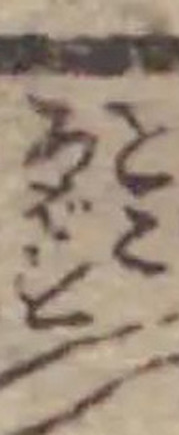ろばす
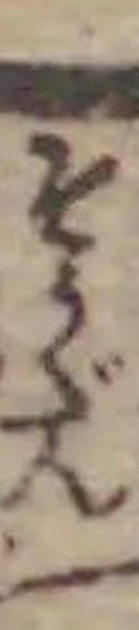そうだん
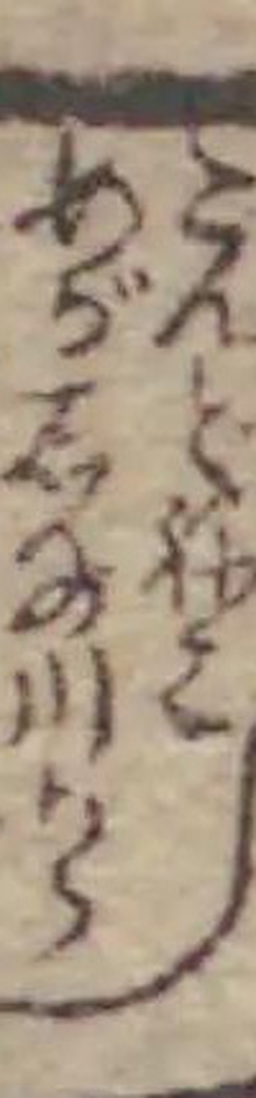めがしな川から
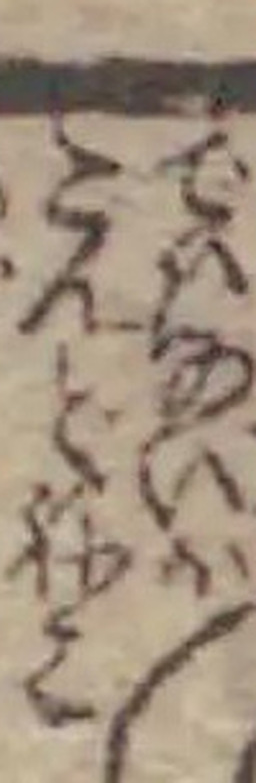ごんどねこ
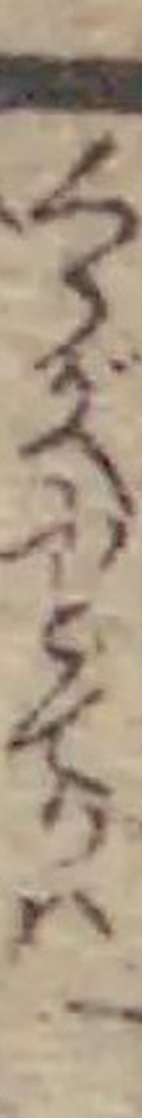くらがへにどてかは
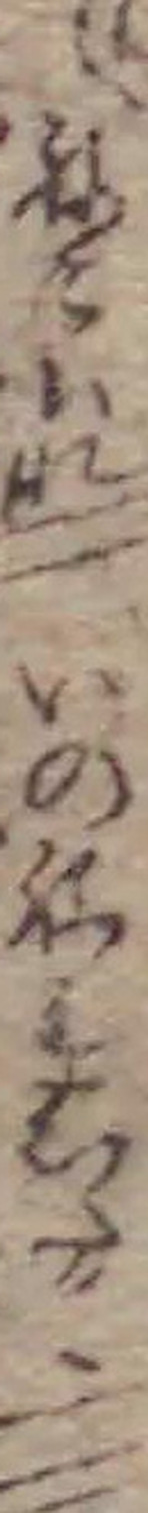ねこはれいのねこした
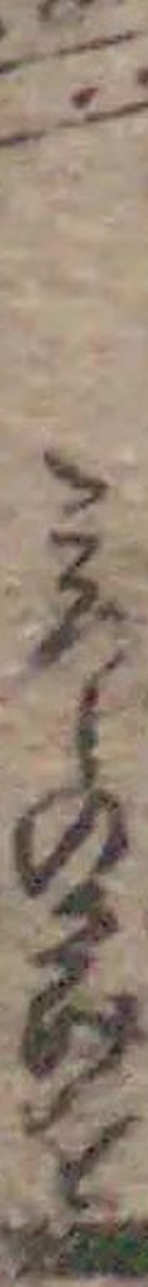ころしのさけを
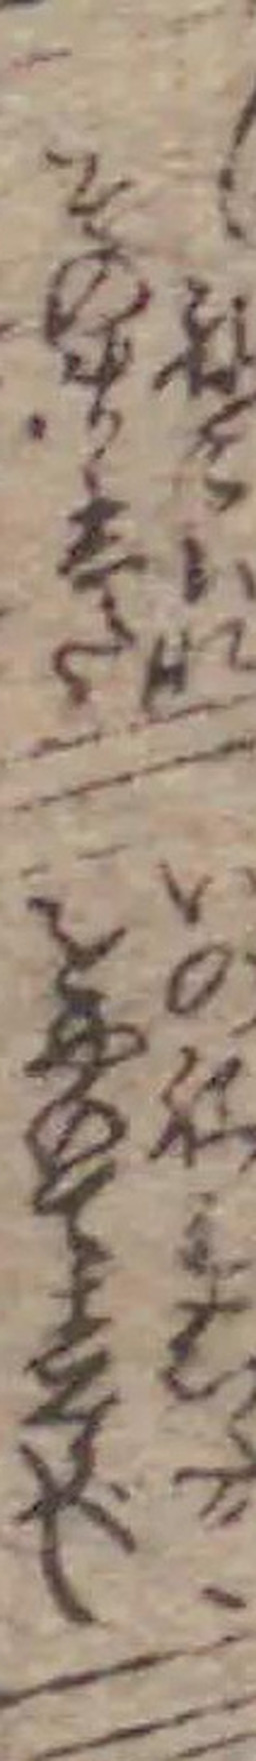そのまゝしたをやいてしすべし
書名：冷水灰毛猫 2巻
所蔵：国立国会図書館 National Diet Library, JAPAN
